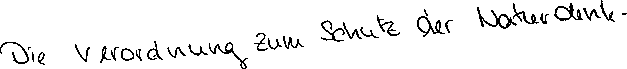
Die Verordnung zum Schutz der Naturdenk-
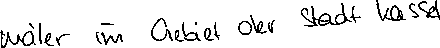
mäler im Gebiet der Stadt Kassel
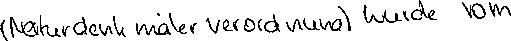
(Naturdenkmälerverordnung) wurde vom
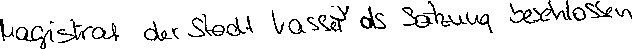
Magistrat der Stadt Kassel als Satzung beschlossen
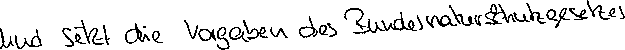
und setzt die Vorgaben des Bundesnaturschutzgesetzes
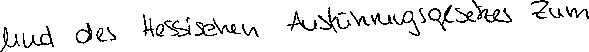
und des Hessischen Ausführungsgesetzes zum
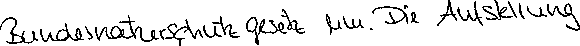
Bundesnaturschutzgesetz um. Die Aufstellung
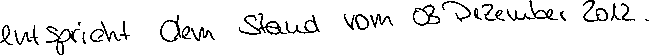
entspricht dem Stand vom 3. Dezember 2012.
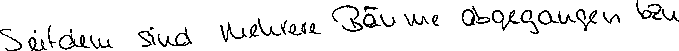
Seitdem sind mehrere Bäume abgegangen, bzw.
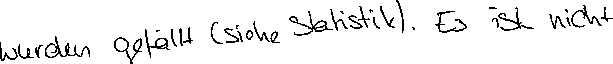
wurden gefällt (siehe Statistik). Es ist nicht
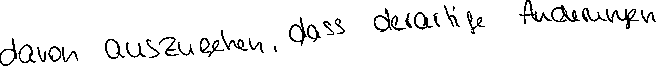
davon auszugehen, dass derartige Änderungen
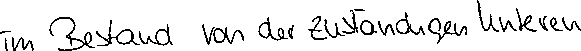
im Bestand von der zuständigen Unteren
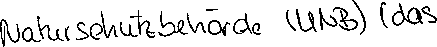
Naturschutzbehörde (UNB) (das
